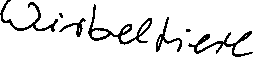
Wirbeltiere
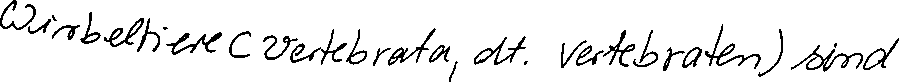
Wirbeltiere (Vertebrata, dt. Vertebraten) sind
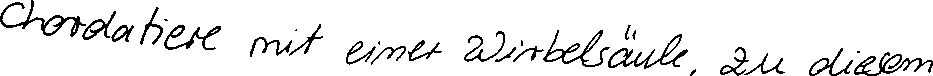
Chordatiere mit einer Wirbelsäule. Zu diesem
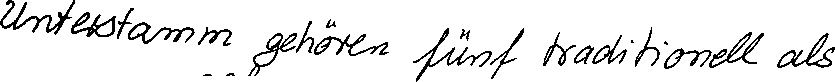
Unterstamm gehören fünf traditionell als
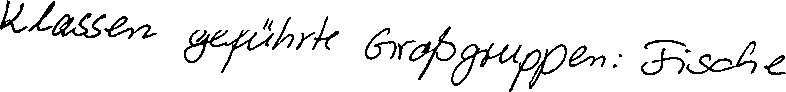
Klassen geführte Großgruppen: Fische
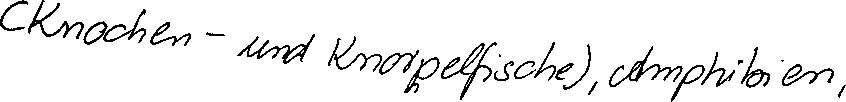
(Knochen- und Knorpelfische), Amphibien,
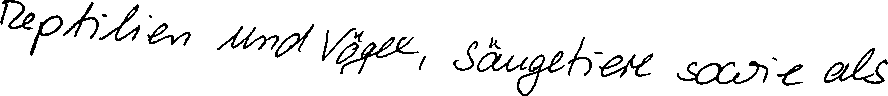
Reptilien und Vögel, Säugetiere sowie als
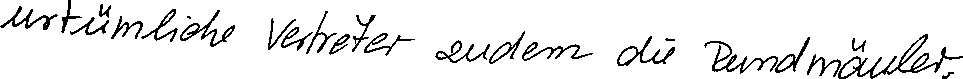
urtümliche Vertreter zudem die Rundmäuler.
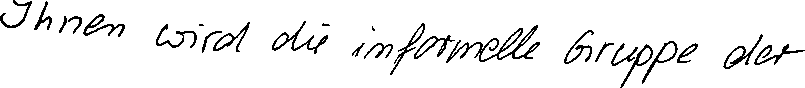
Ihnen wird die informelle Gruppe der
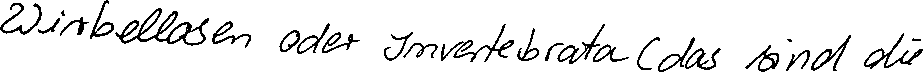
Wirbellosen oder Invertebrata (das sind alle
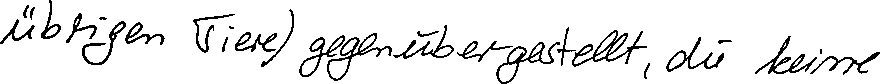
übrigen Tiere) gegenübergestellt, die keine
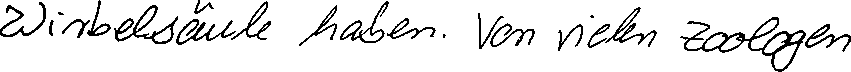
Wirbelsäule haben. Von vielen Zoologen
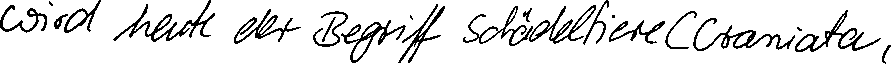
wird heute der Begriff Schädeltiere (Craniata,
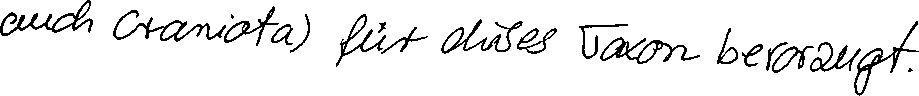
auch Craniota) für dieses Taxon bevorzugt.
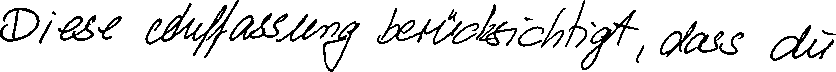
Diese Auffassung berücksichtigt, dass die
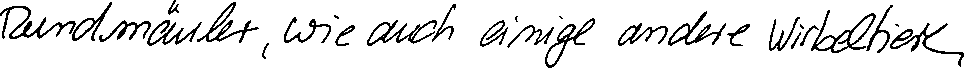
Rundmäuler, wie auch einige andere Wirbeltiere,
